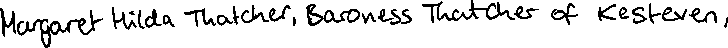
Margaret Hilda Thatcher, Baroness Thatcher of Kesteven,
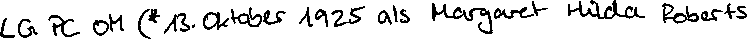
LG PC OM (* 13. Oktober 1925 als Margaret Hilda Roberts
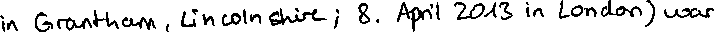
in Grantham, Lincolnshire; 8. April 2013 in London) war
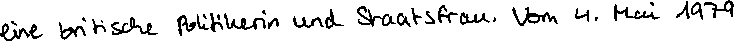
eine britische Politikerin und Staatsfrau. Vom 4. Mai 1979
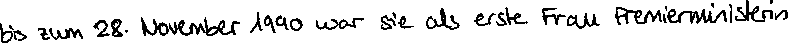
is zum 28. November 1990 war sie als erste Frau Premierministerin
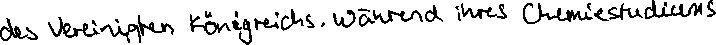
des Vereinigten Königreichs. Während ihres Chemiestudiums
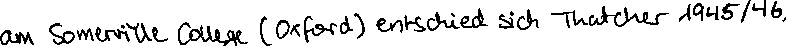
am Somerville College (Oxford) entschied sich Thatcher 1945/46,
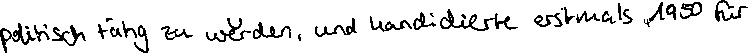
politisch tätig zu werden, und kandidierte erstmals 1950 für
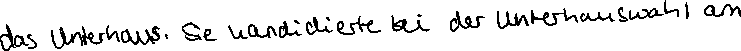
das Unterhaus. Sie kandidierte bei der Unterhauswahl am
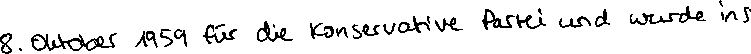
8. Oktober 1959 für die Konservative Partei und wurde ins
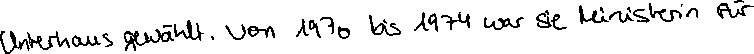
Unterhaus gewählt. Von 1970 bis 1974 war sie Ministerin für
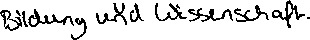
Bildung und Wissenschaft
